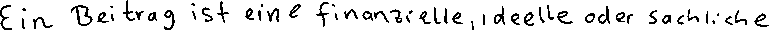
Ein Beitrag ist eine finanzielle, ideelle oder sachliche
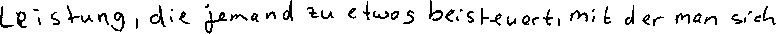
Leistung, die jemand zu etwas beisteuert, mit der man sich
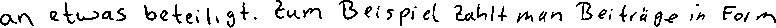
an etwas beteiligt. Zum Beispiel zahlt man Beiträge in Form
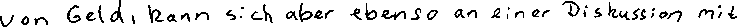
von Geld, kann sich aber ebenso an einer Diskussion mit
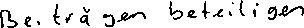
eiträgen beteiligen.
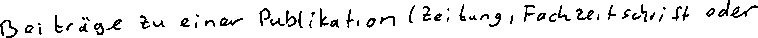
Beiträge zu einer Publikation (Zeitung, Fachzeitschrift oder
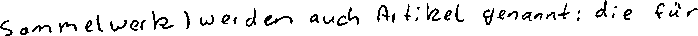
Sammelwerk) werden auch Artikel genannt; die für
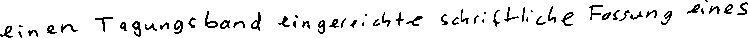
einen Tagungsband eingereichte schriftliche Fassung eines
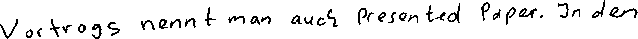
Vortrags nennt man auch Presented Paper. In den
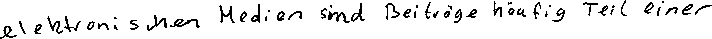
lektronischen Medien sind Beiträge häufig Teil einer
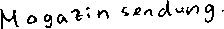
Magazinsendung.
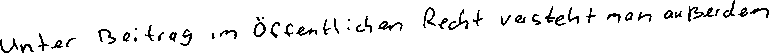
Unter Beitrag im Öffentlichen Recht versteht man außerdem
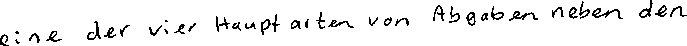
eine der vier Hauptarten von Abgaben neben den
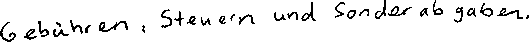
Gebühren, Steuern und Sonderabgaben.
